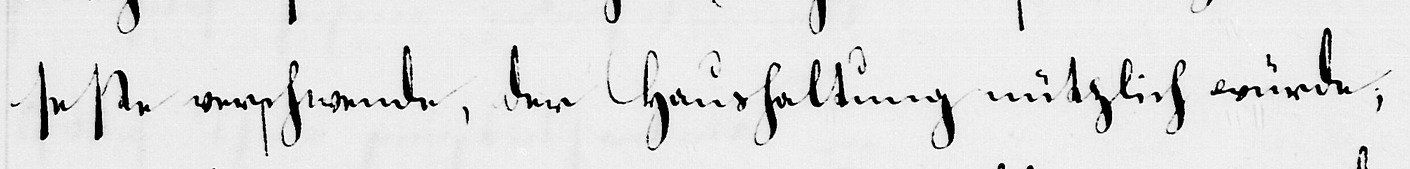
seste verschwende, der Haushaltung nützlich würde,
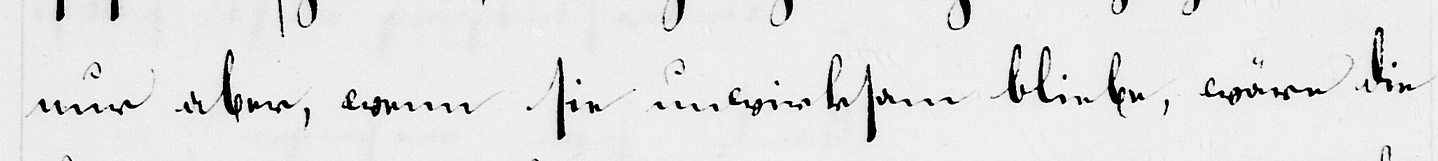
nur aber, wenn sie unwirksam bliebe, wäre die
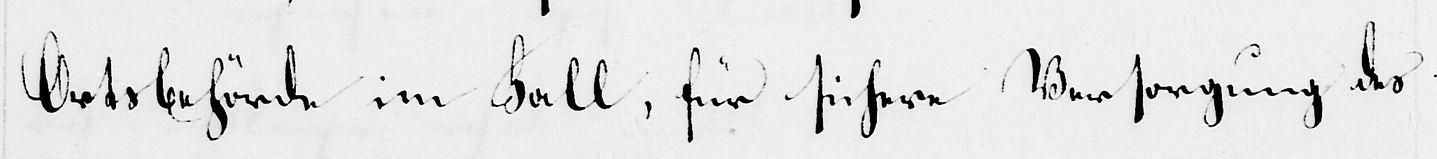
Ortsbehörde im Fall, für sichere Versorgung des
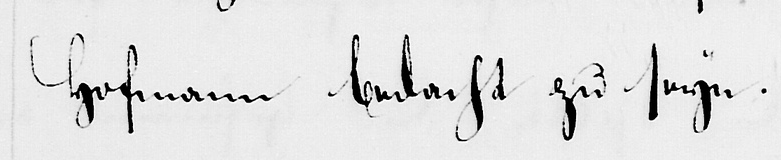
Hofmann bedacht zu seyn.
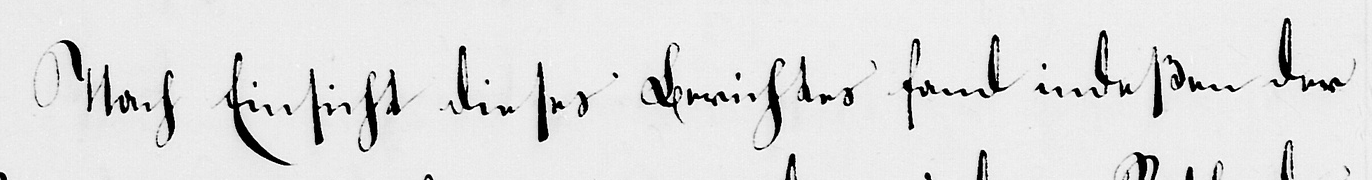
Nach Einsicht dieses Berichtes fand indeßen der
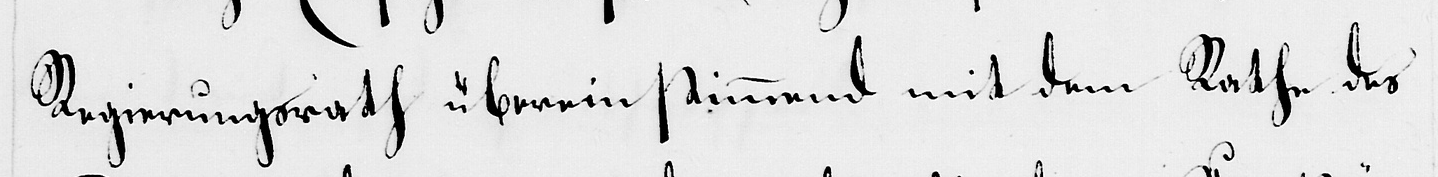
Regierungsrath übereinstimmend mit dem Rathe des
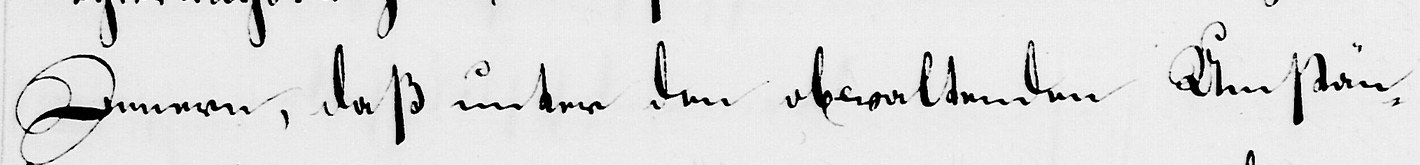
Innern, daß unter den obwaltenden Umstän¬
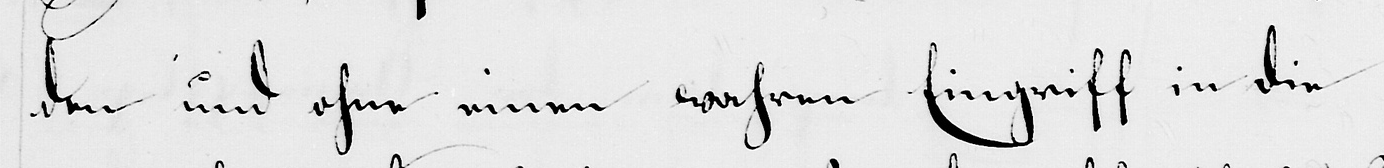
den und ohne einen wahren Eingriff in die
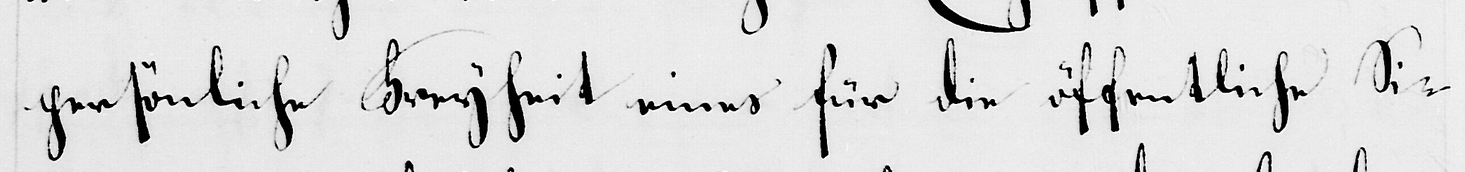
persönliche Freyheit eines für die öffentliche Si¬
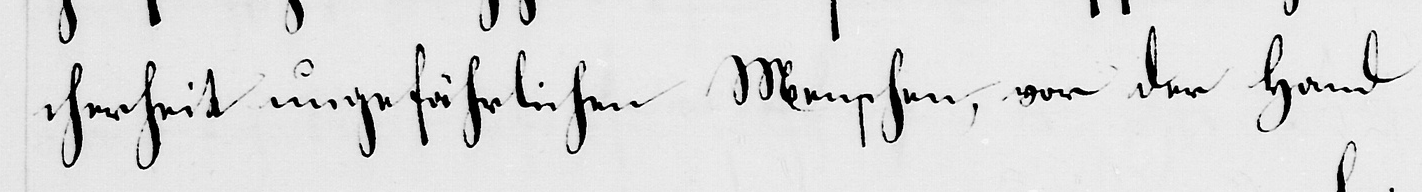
cherheit ungefährlichen Menschen, von der Hand
